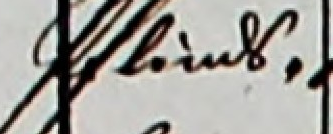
Pflinds„
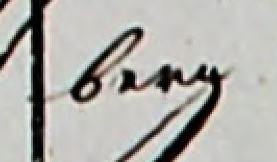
berg
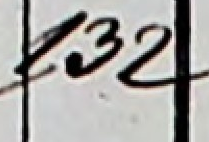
132
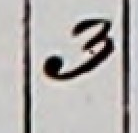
3
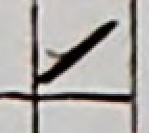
1
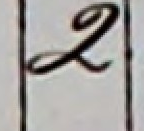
2
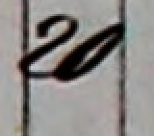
20
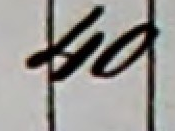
40
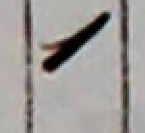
1
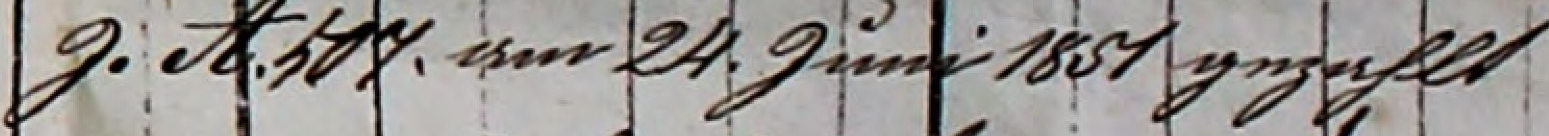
J. A. 507. am 24. Juni 1851 gezahlt
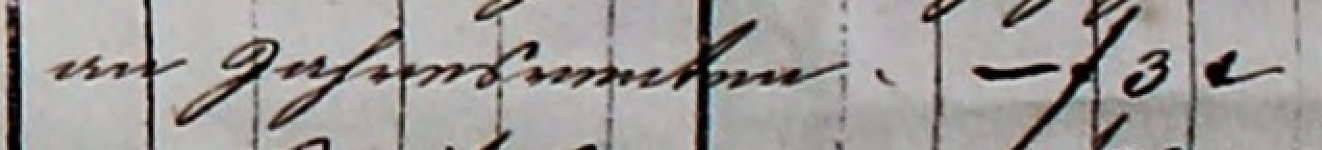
an Jahresrenten - f 3 &
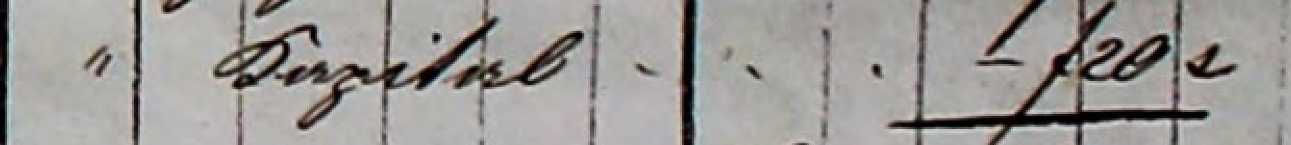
„ Kapital - f 20 &
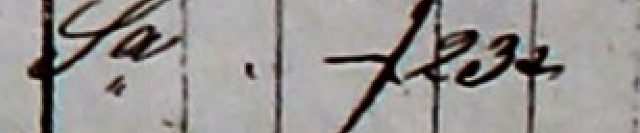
Sa - f 23 &
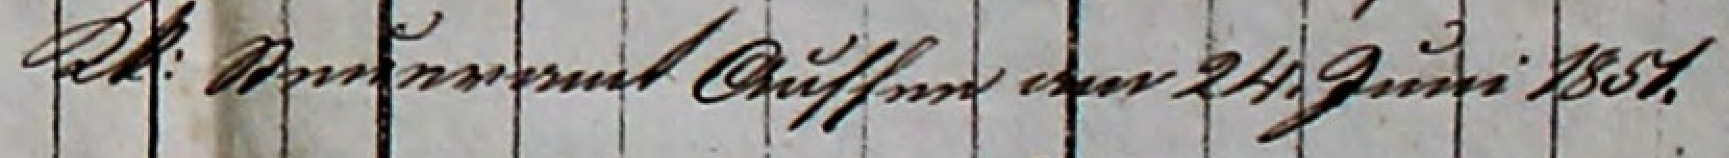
Kl. Steueramt Aussee am 24. Juni 1851.
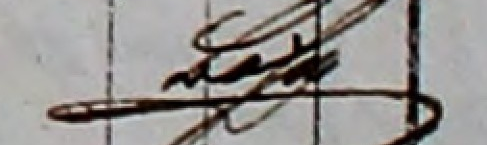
Bohn
